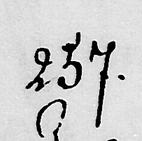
euen
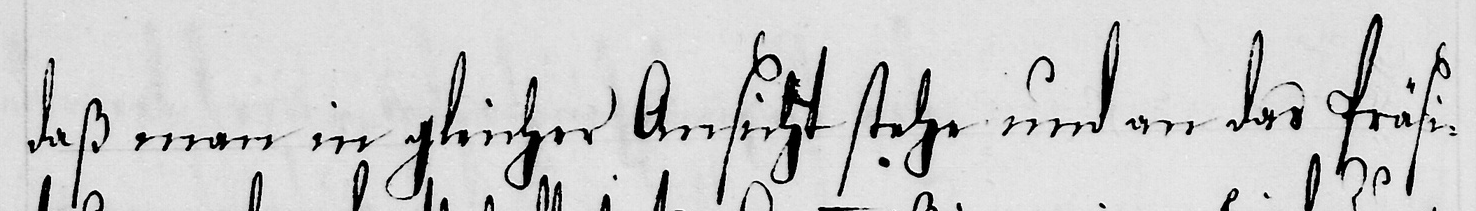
daß man in gleicher Ansicht stehe und an das Präsi¬
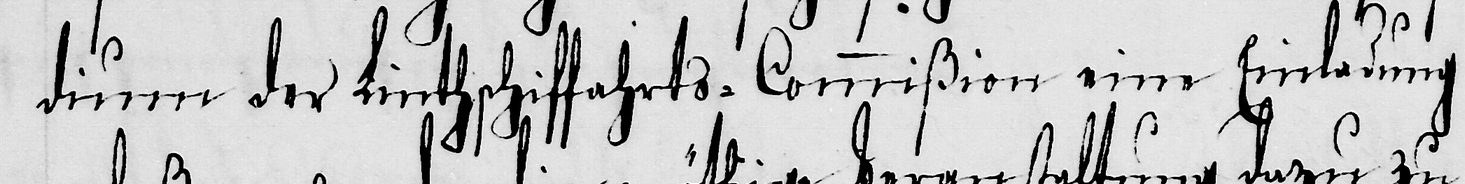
dium der Linthschiffahrts-Commißion eine Einladung
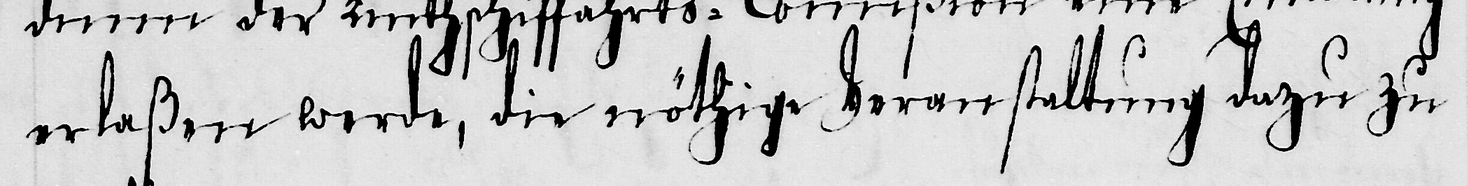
erlaßen werde, die nöthige Veranstaltung dazu zu
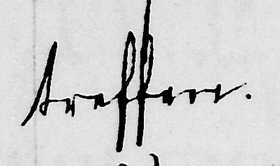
treffen.
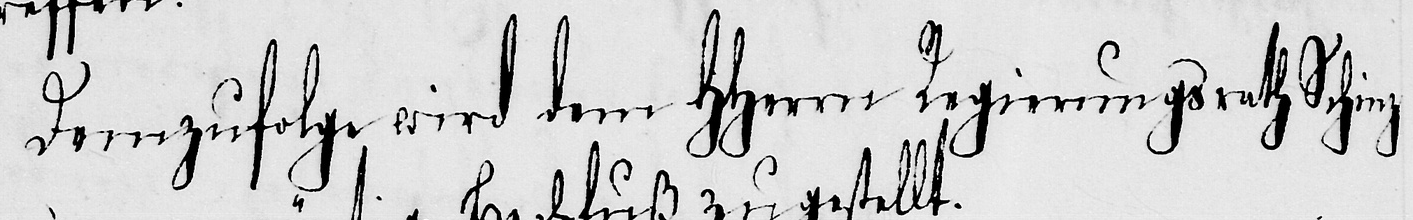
Demzufolge wird dem HHerrn Regierungsrath
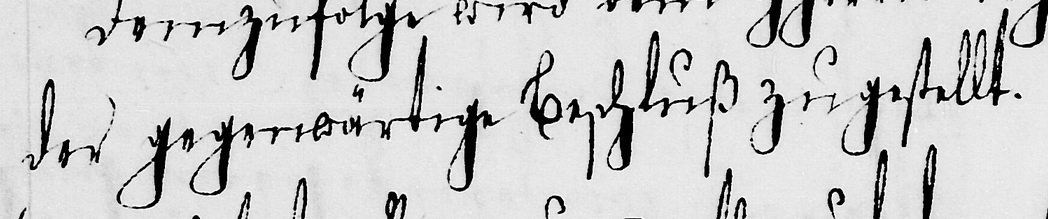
der gegenwärtige Beschluß zugestellt.
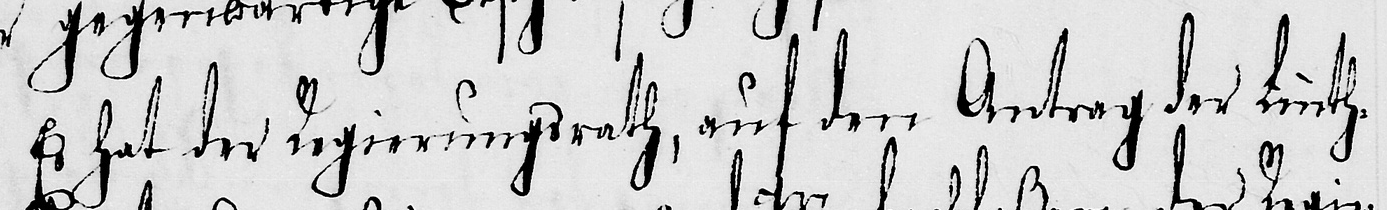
Es hat der Regierungsrath, auf den Antrag der Linth¬
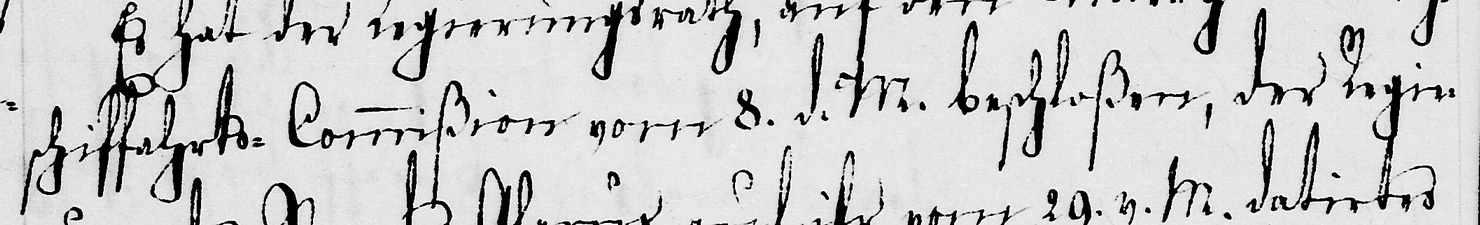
schiffahrts-Commißion vom 8. d. M. beschloßen, der Regie¬
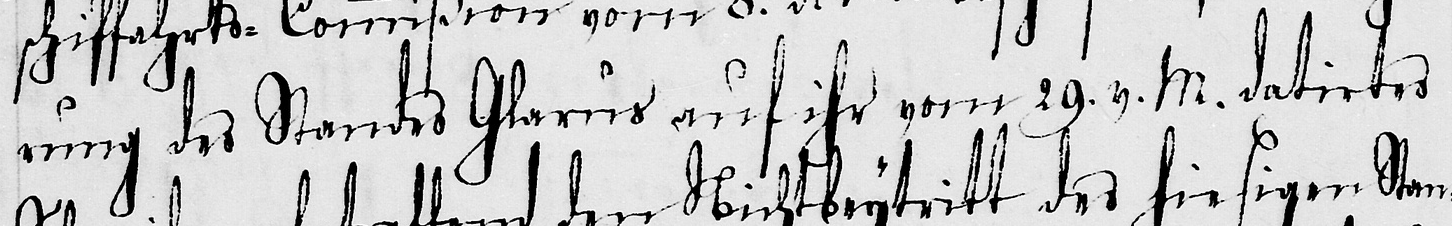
rung des Standes Glarus auf ihr vom 29. v. M. datirtes
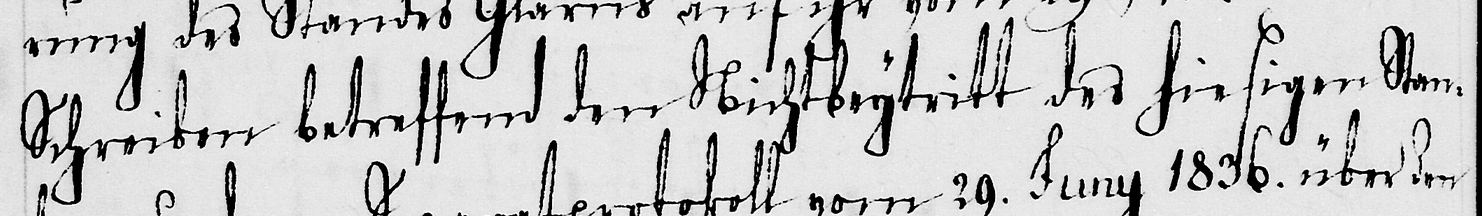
Schreiben betreffend den Nichtbeytritt des hiesigen Stan¬
